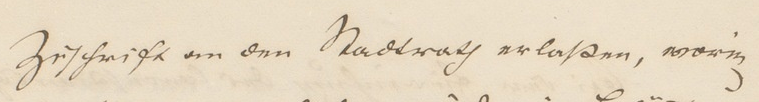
Zuschrift an den Stadtrath erlaßen, worin
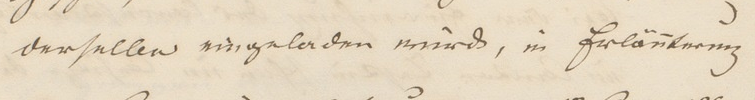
derselbe eingeladen wird, in Erläuterung
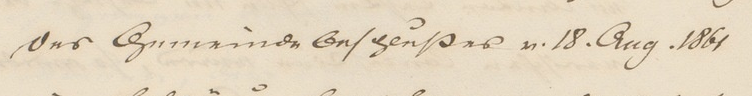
des Gemeindebeschlußes v. 18. Aug. 1861
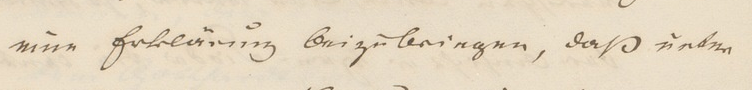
eine Erklärung beizubringen, daß unter
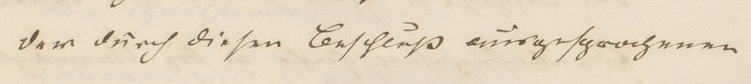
der durch diesen Beschluß ausgesprochenen
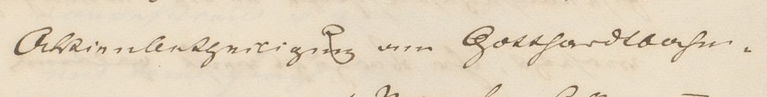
Aktienbetheiligung am Gotthardtbahn-
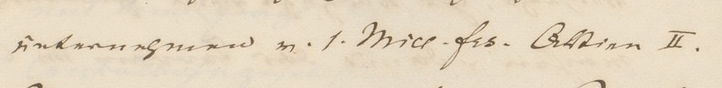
unternehmen v. 1. Mill. frs. Aktien II.
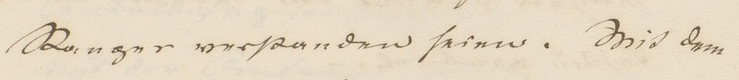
Ranges verstanden seien. Mit dem
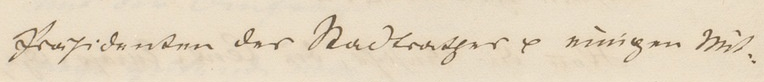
Präsidenten des Stadtrathes & einigen Mit-
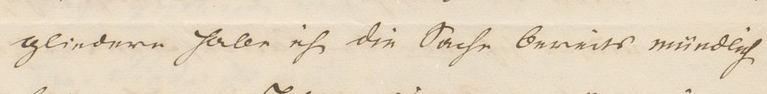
gliedern habe ich die Sache bereits mündlich
